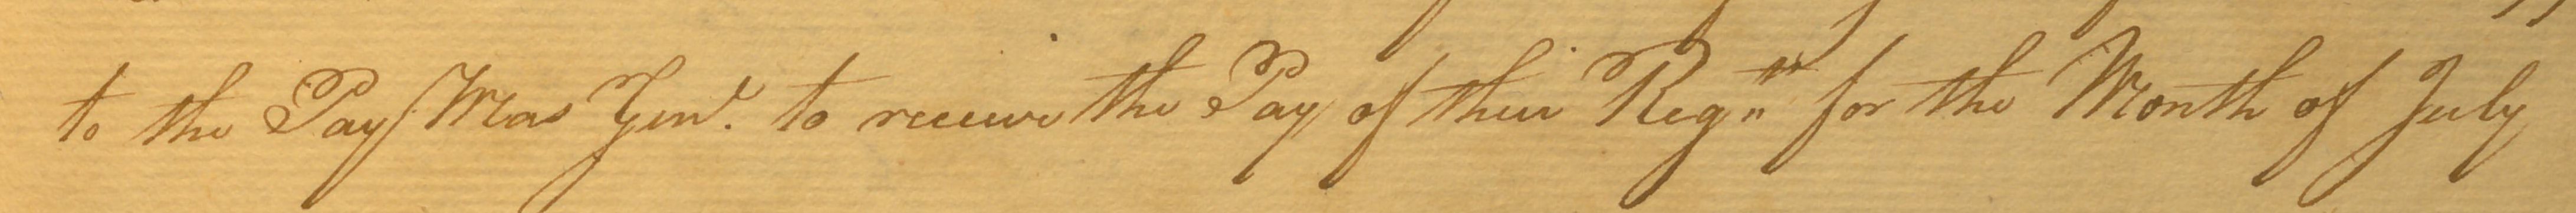to the Pay Mas Gen^l. to receive the Pay of the Reg^ts. for the Month of July
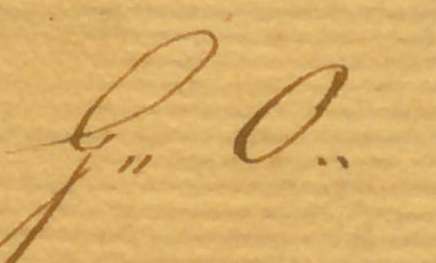G.O.
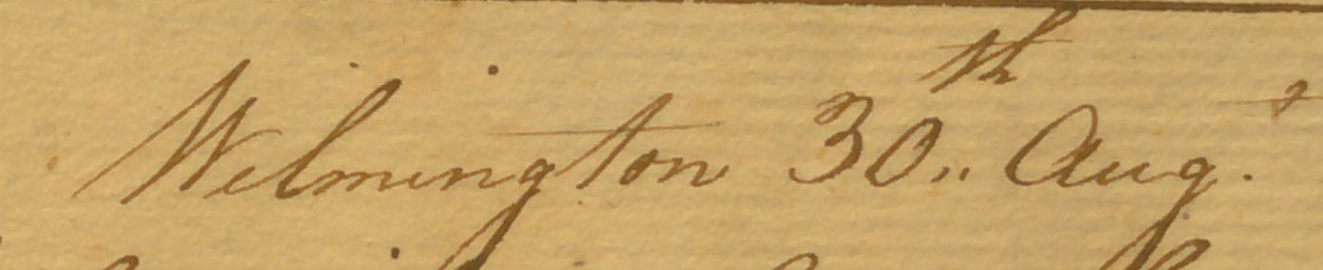Wilmington 30^th. Aug^t.
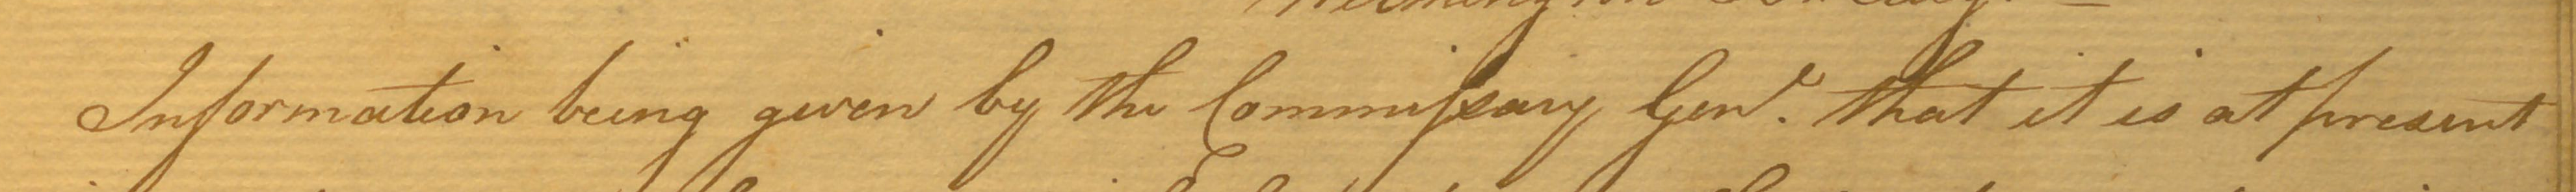Information being given by the Commissary Gen^l. that it is at present
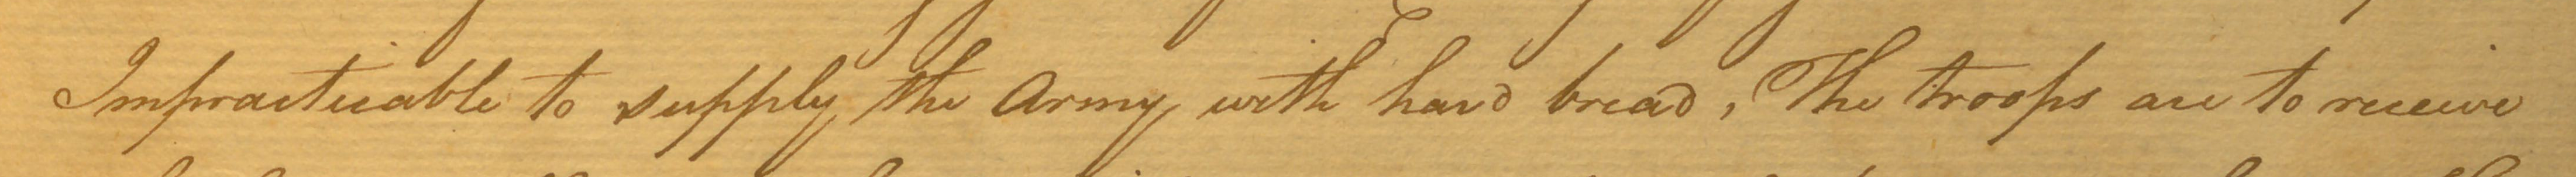Impracticable to supply the Army with hard bread, The Troops are to receive
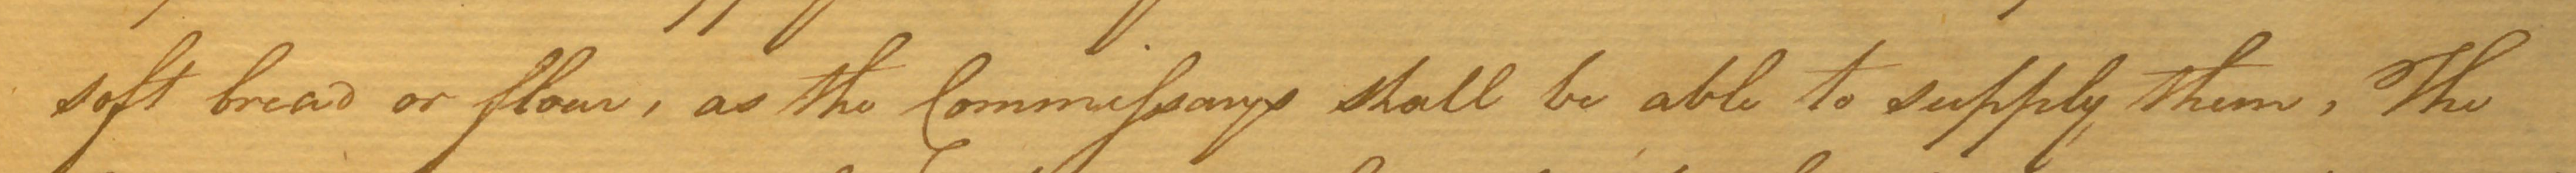soft bread or flour, as the Commissarys shall be able to supply them, The
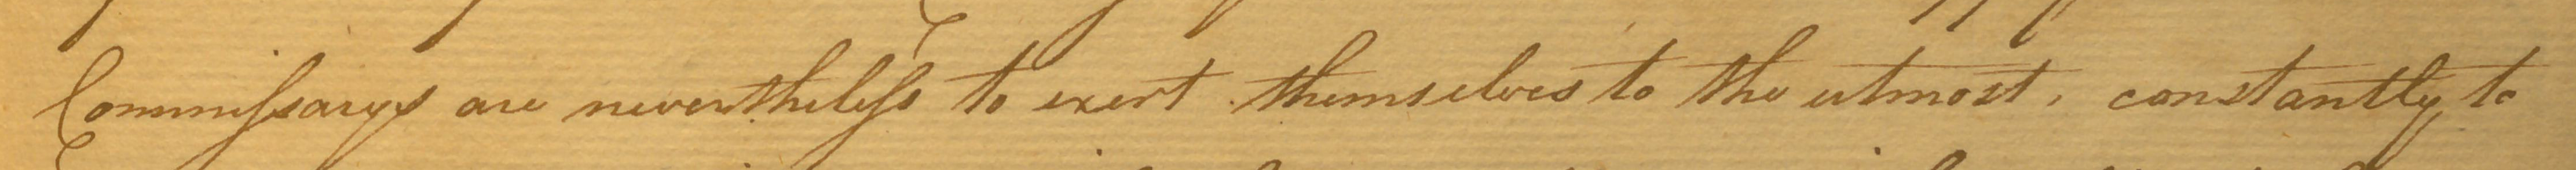Commissarys are nevertheless to exert themselves to the utmost, constantly to
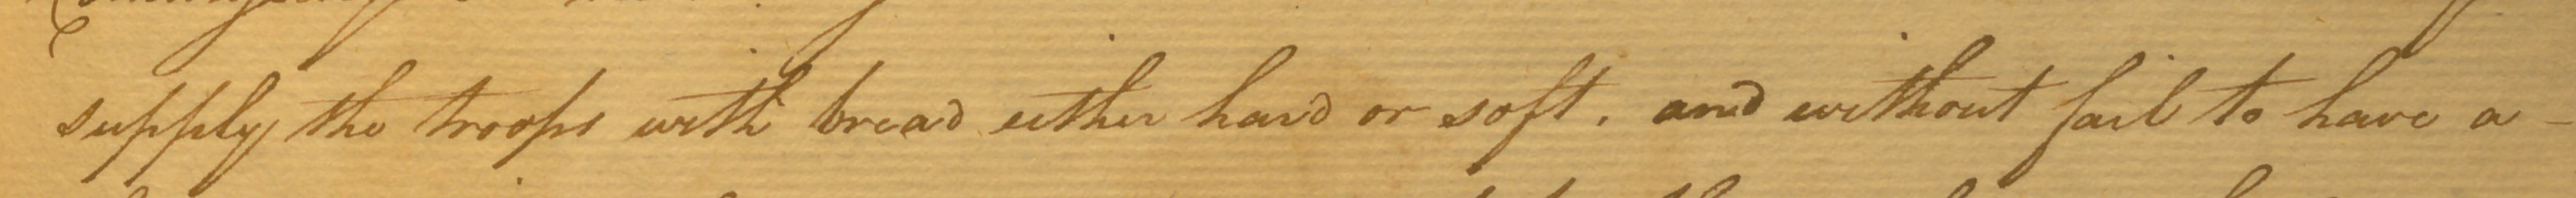supply the troops with bread either hard or soft, and without fail to have a
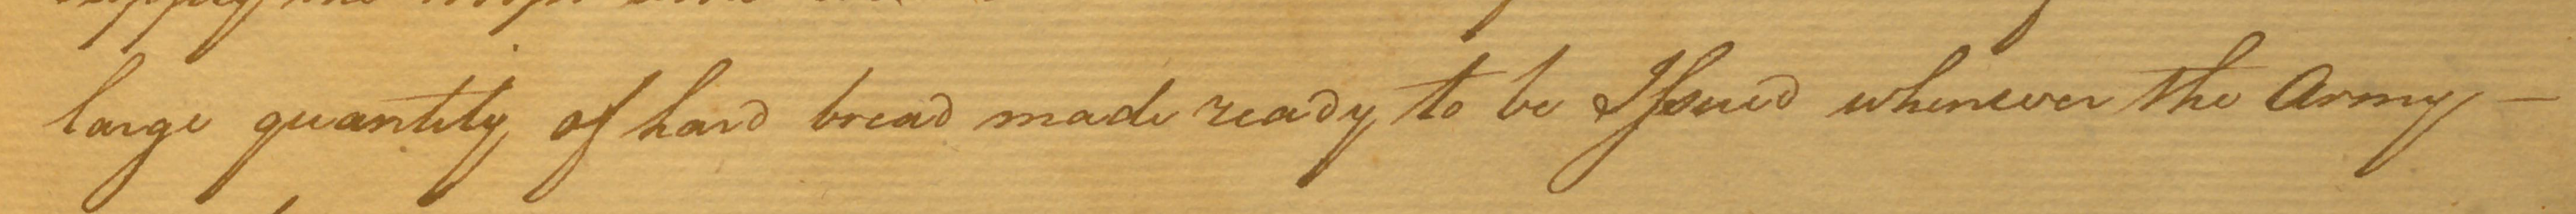large quantity of hard bread made ready to be Issued whenever the Army-
